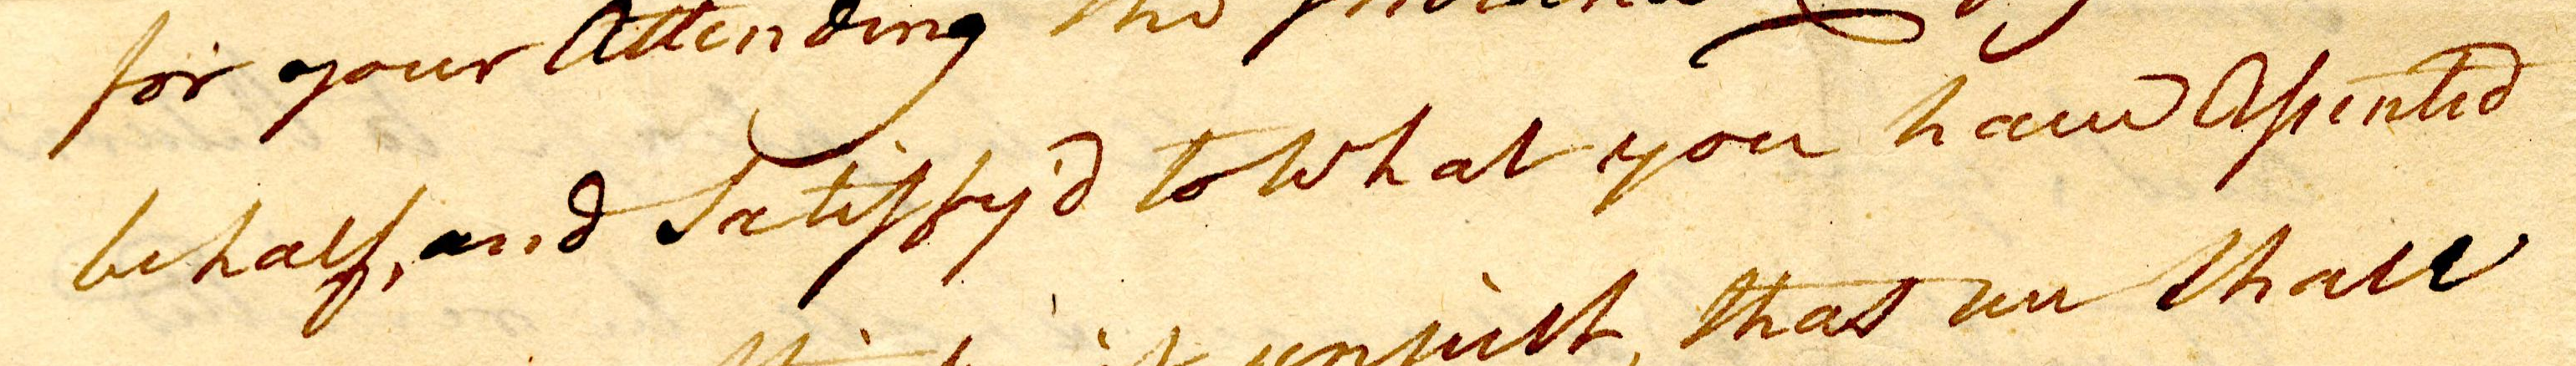behalf, and Satisfy'd to what you have assented
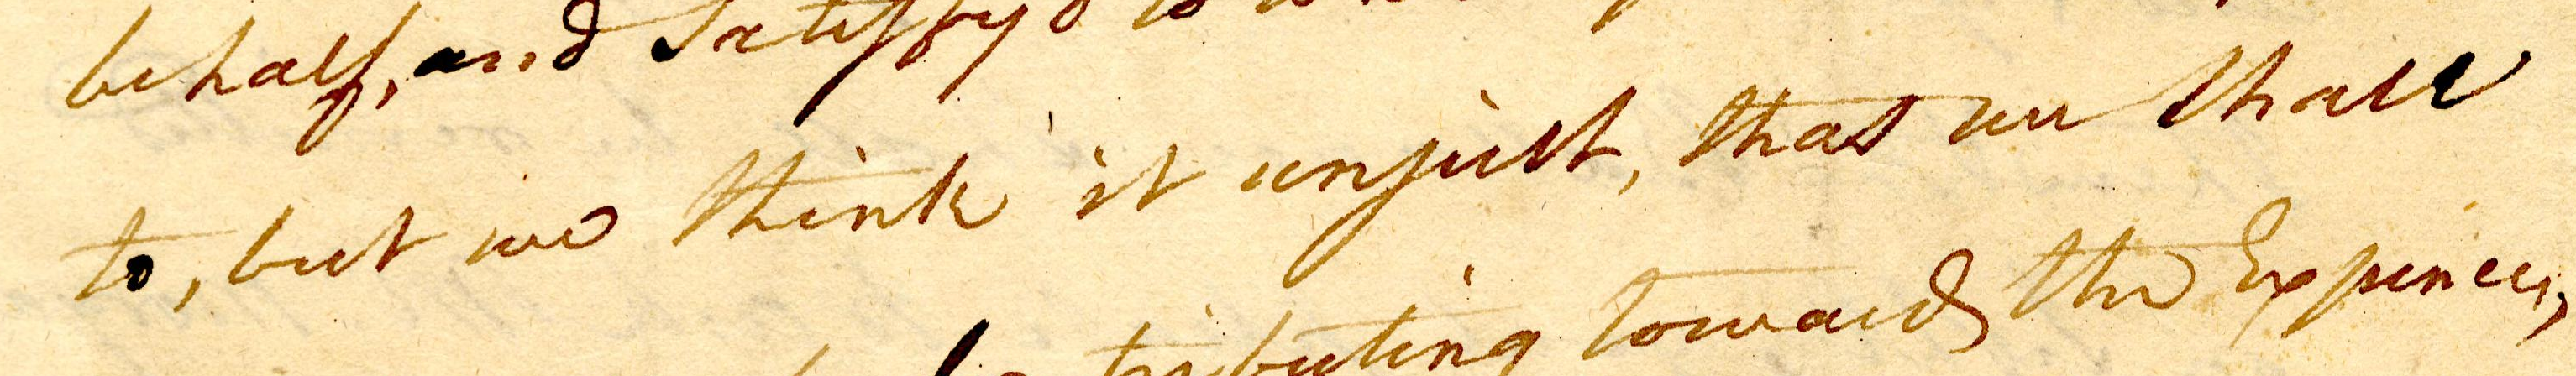to, but we think it unjust, that an shall
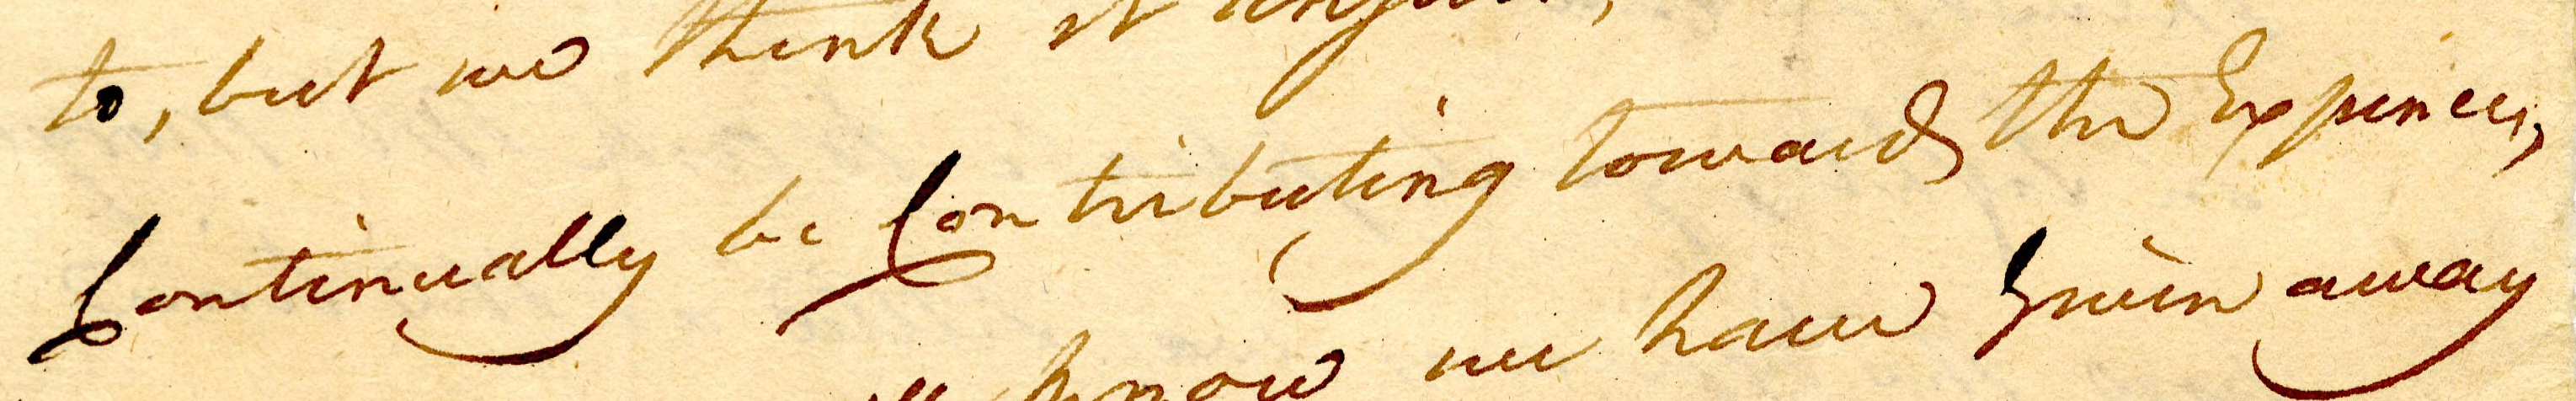continually be Contributing towards the Expences
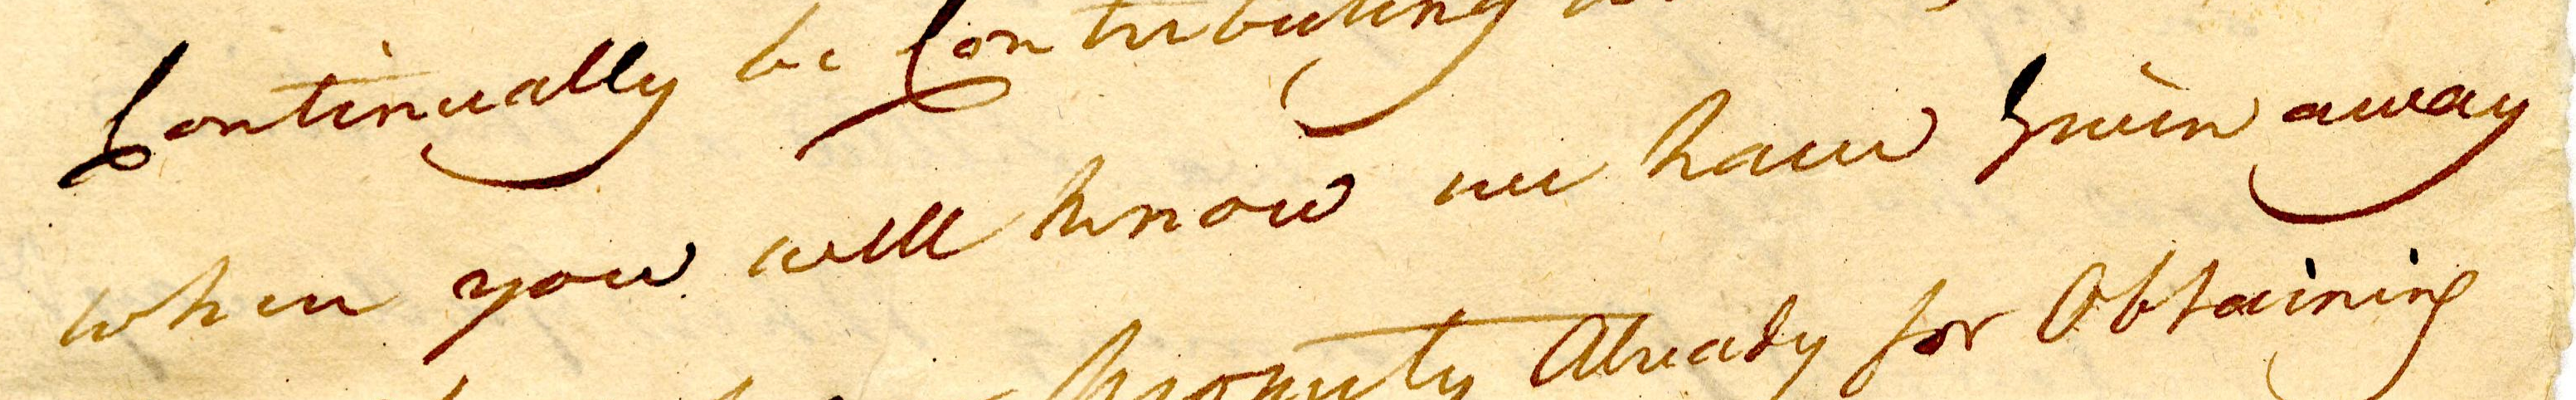when you well know we have Given away
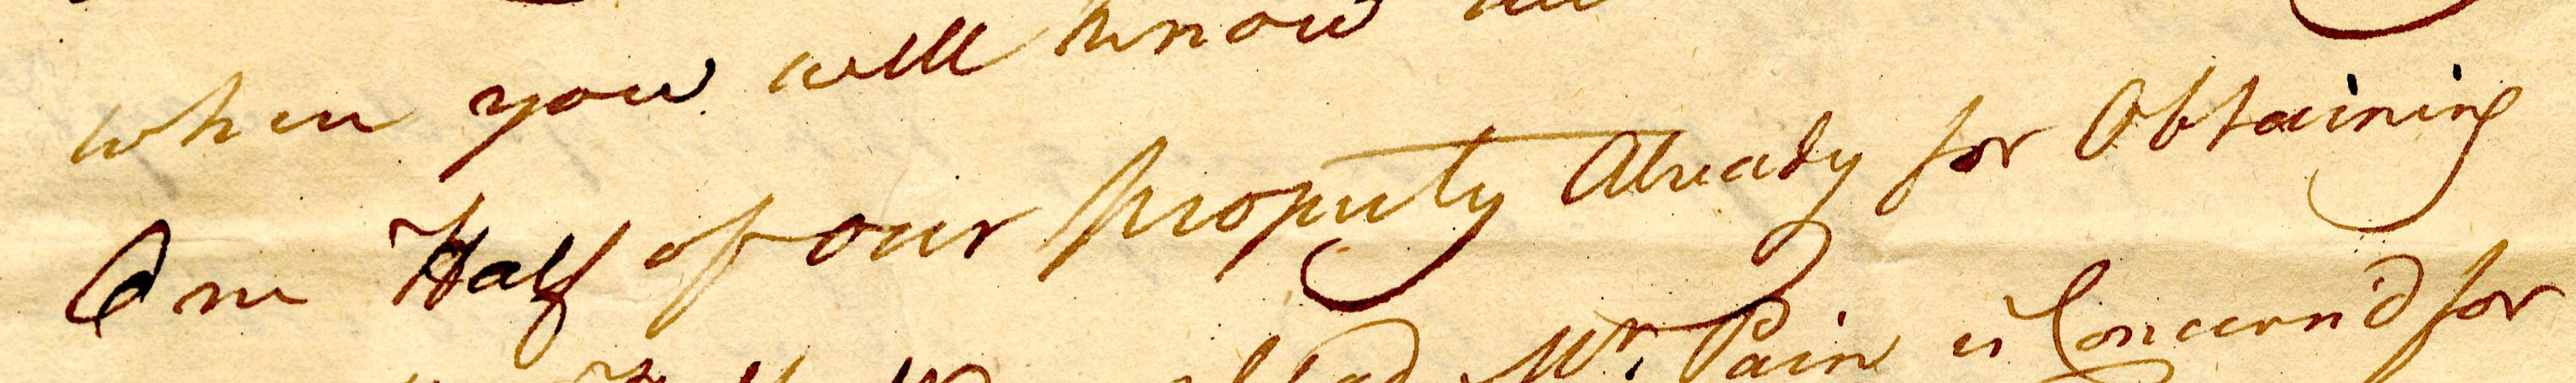One half of our property already for Obtaining
